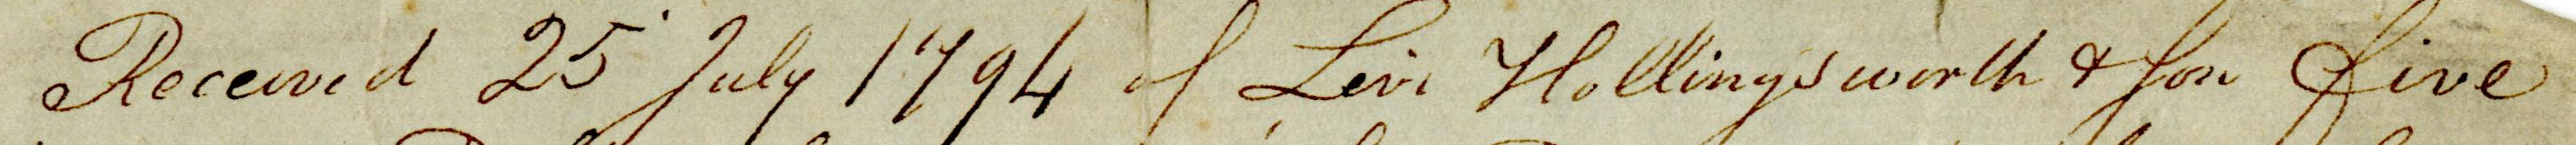Received 25 July 1794 of Levi Hollingswenth & for five
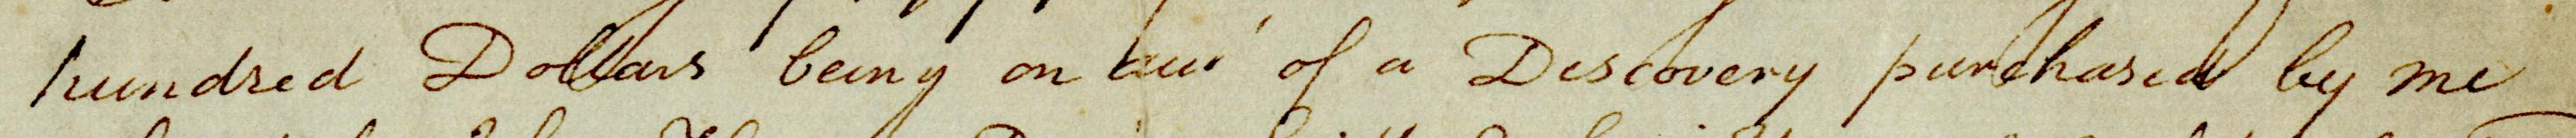hundred Dollars being on bon of a Discovery purchased by me
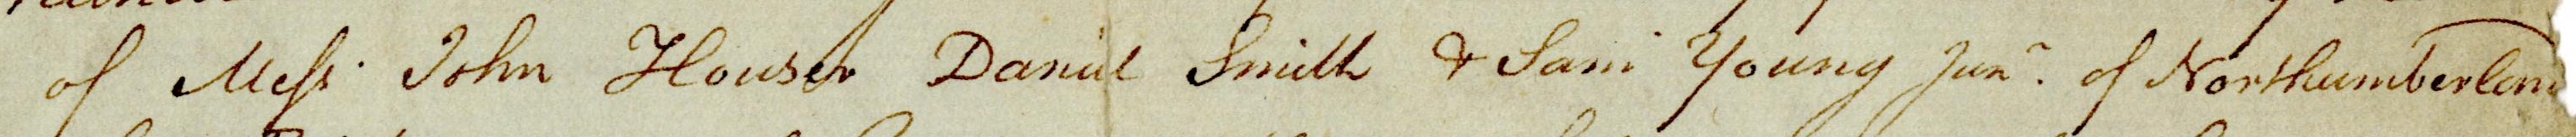of Mess. John Houser Daniel Smith & Ian Young Jun^r. of Northumberland
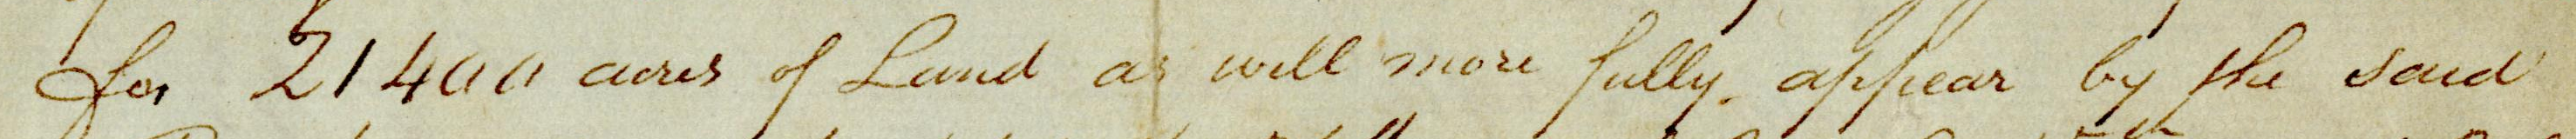for 21400 acres of Land as will more fully appear by the said
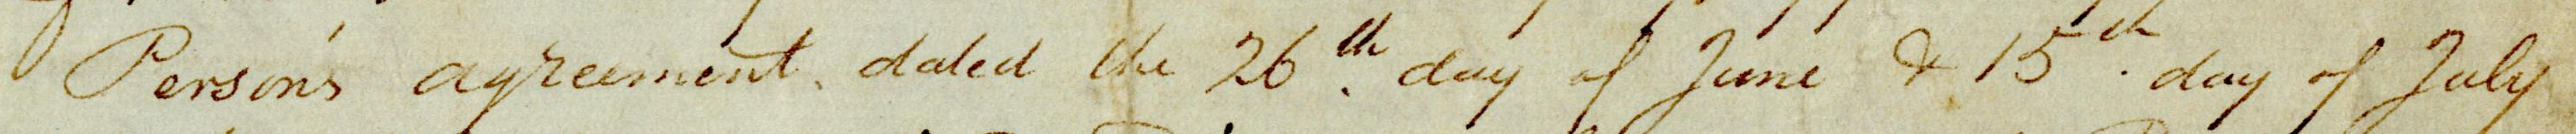Person's agreement dated the 26^th. day of June & 15^th. day of July
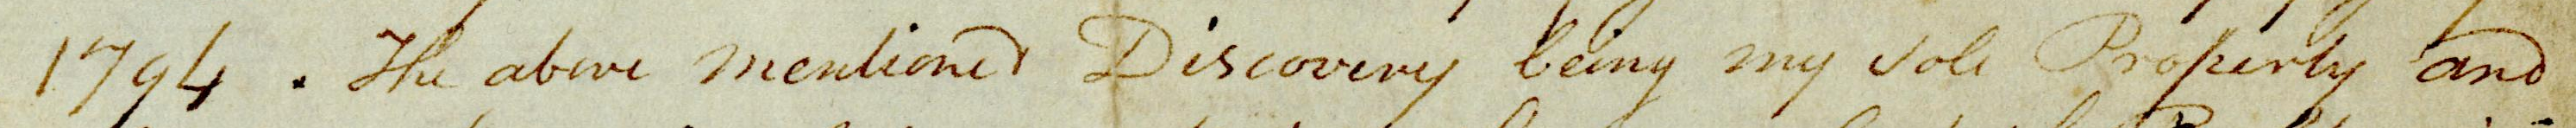1794. The above mentioned Discovery being my sole Property and
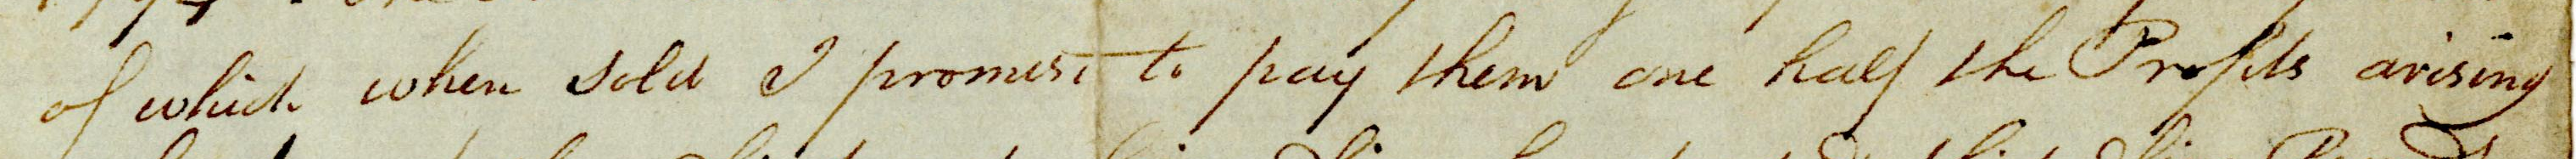of which when sold I promise to pay them one half the Profits arising
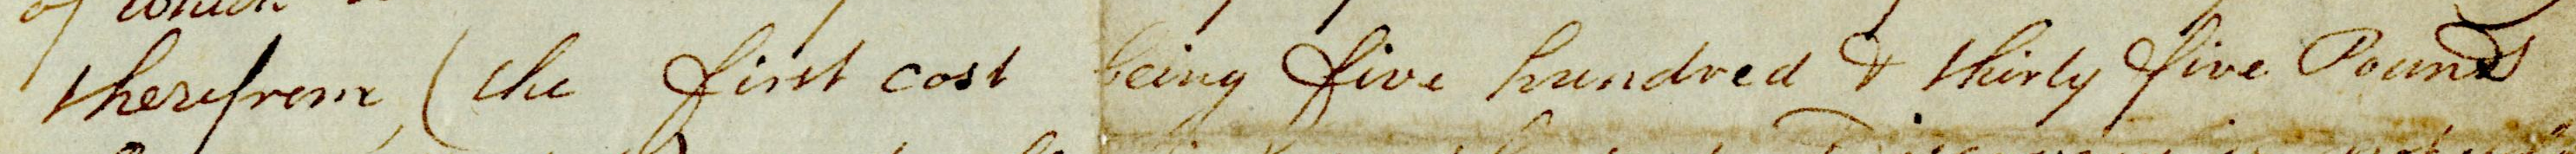therefrom (the first cost being five hundred & thirty five Pounds
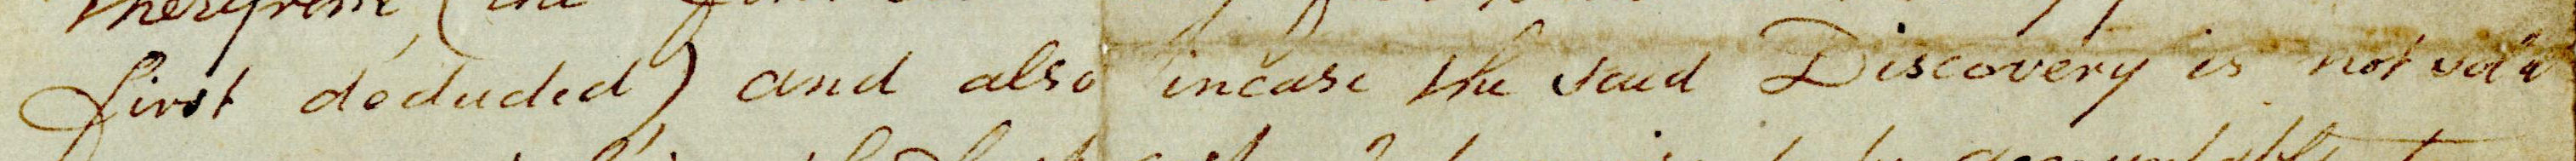first deducted) and also in case the said Discovery is not [___]
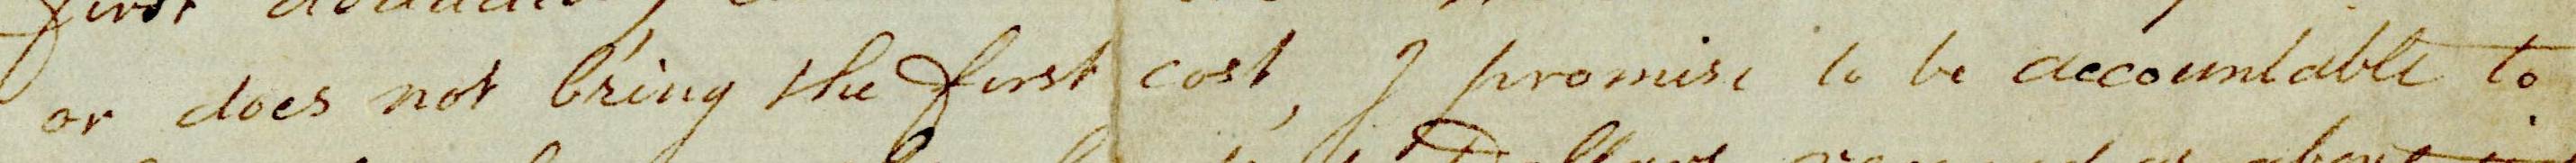or does not bring the first cost, I promise to be decountable to
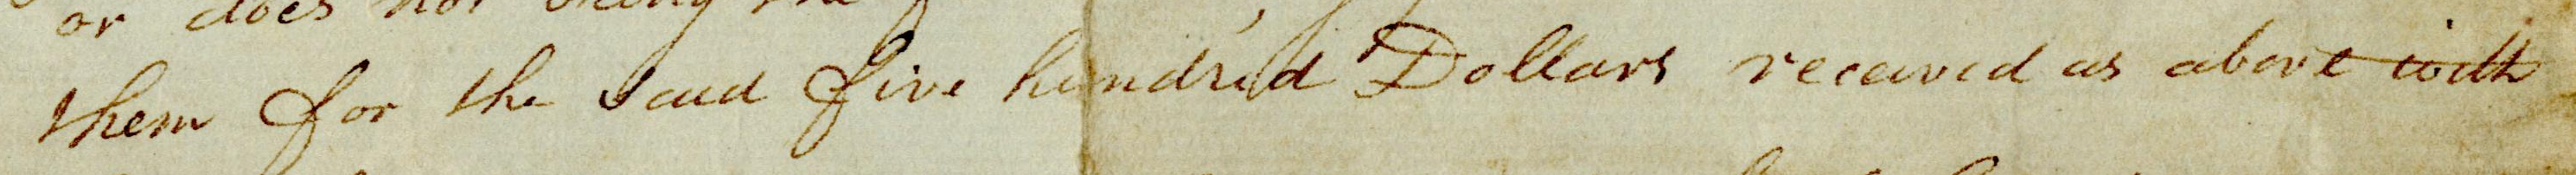them for the said five hundred Dollars received as above with
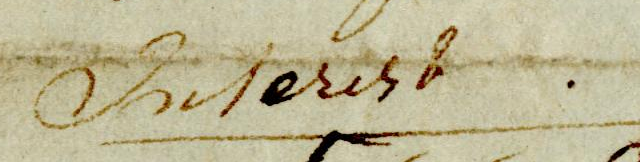Interest.
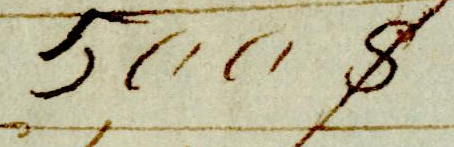500$
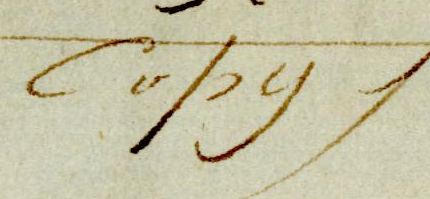Copy
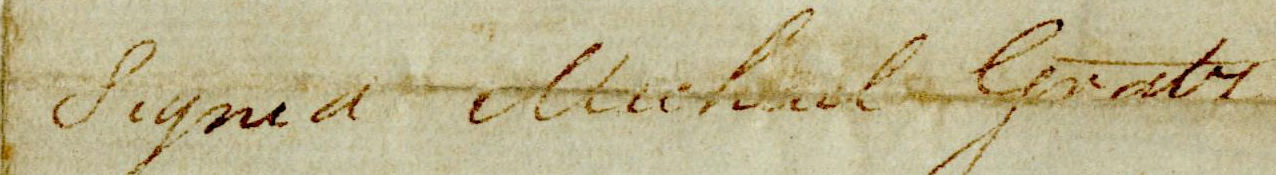Signed Michael Gratz
